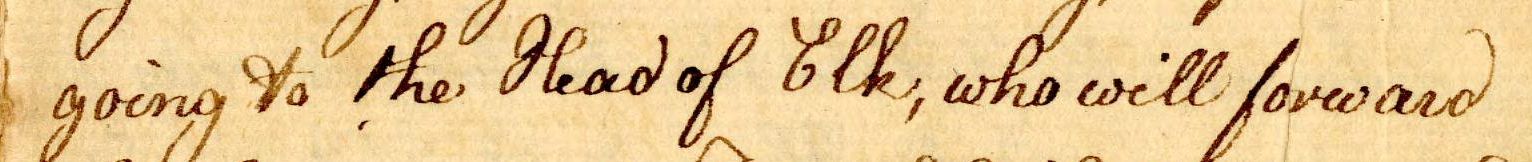going to the Head of Elk, who will forward
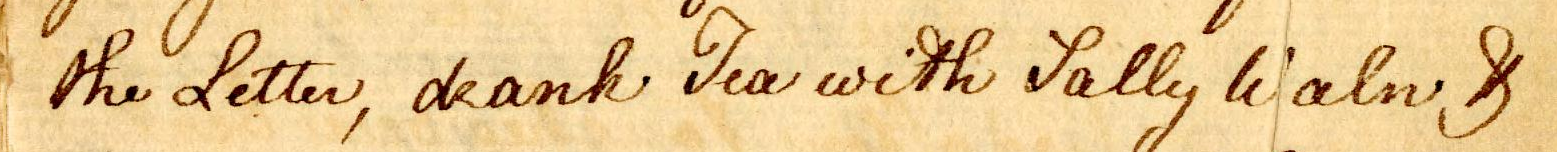the Letter, drank Tea with Sally Waln, &
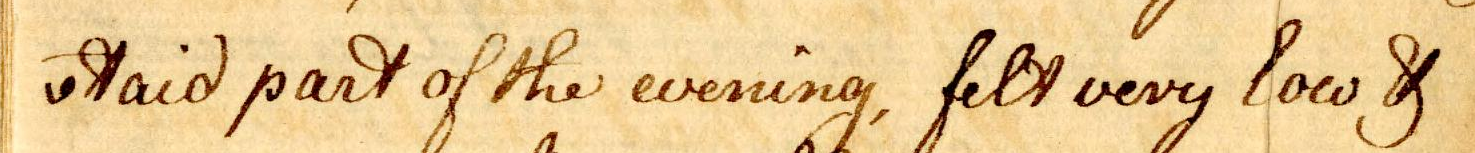staid part of the evening, felt very low &
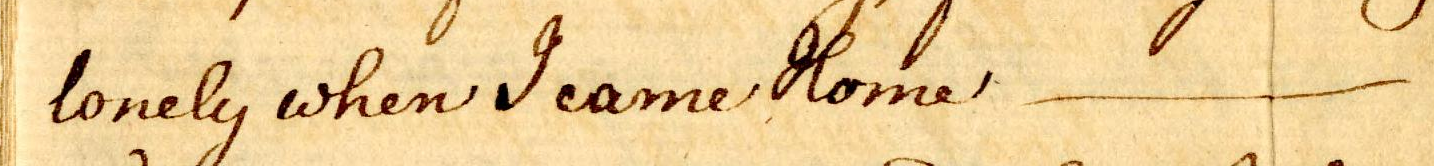lonely when I came Home-
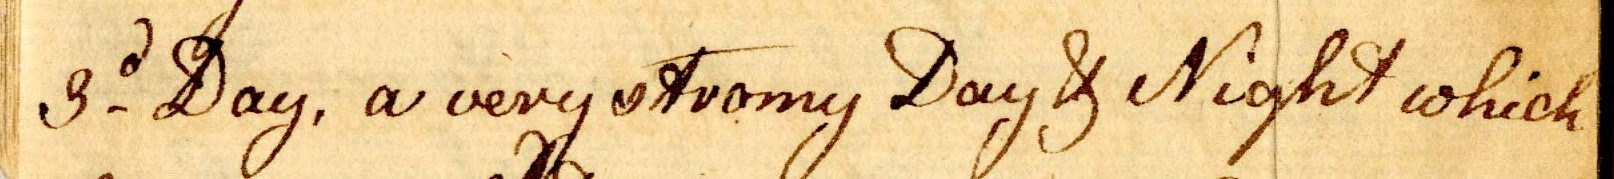3^d. Day, a very stromy Day & Night which
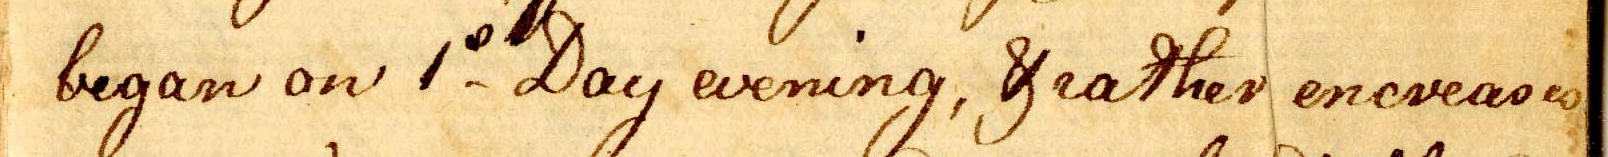began on 1^st Day evening, & rather encreases
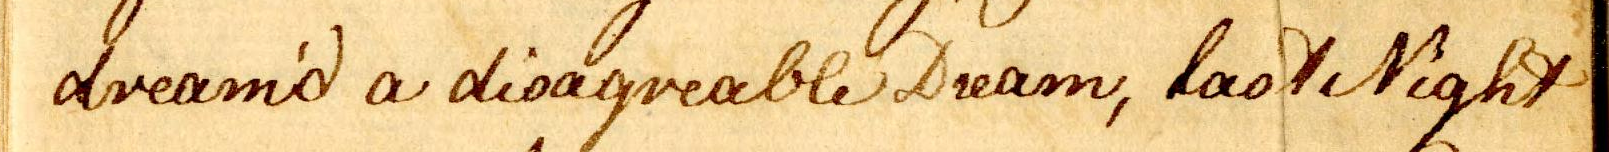dreamd a disagreable Dream, last Night
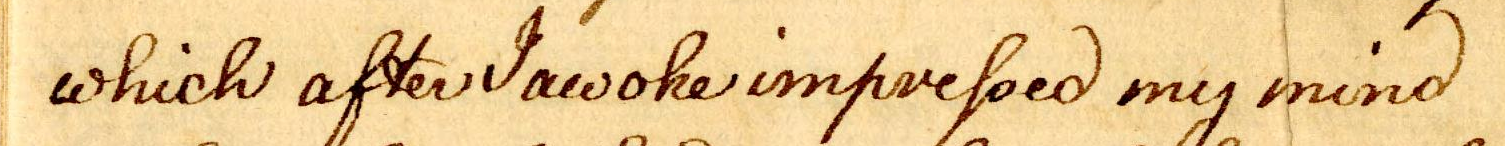which after I awoke impressed my mind
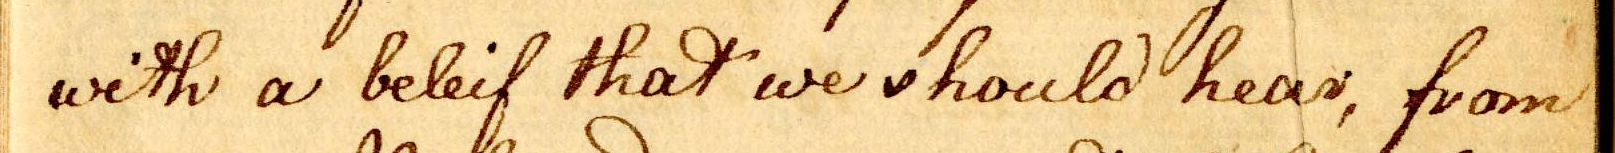with a beleif that we should hear, from
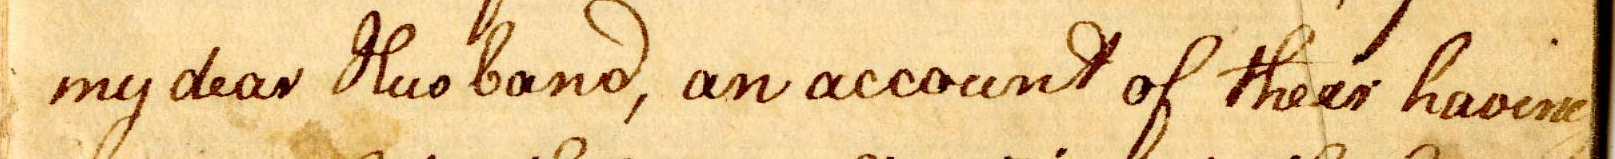my dear Husband, an account of their having
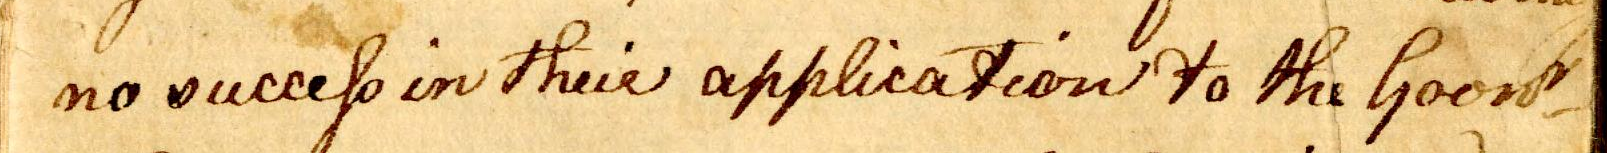no success in their application to the Govn^r
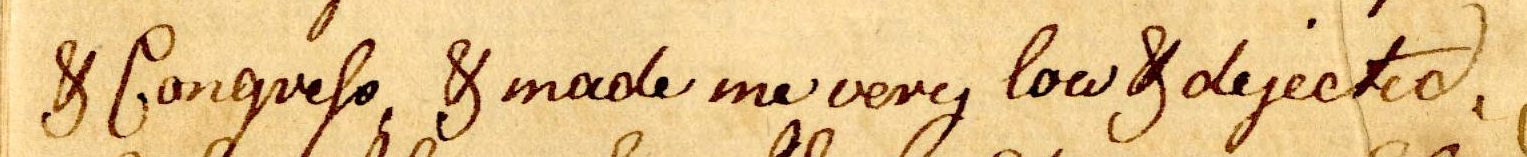& Congress, & made me very low & dejected.
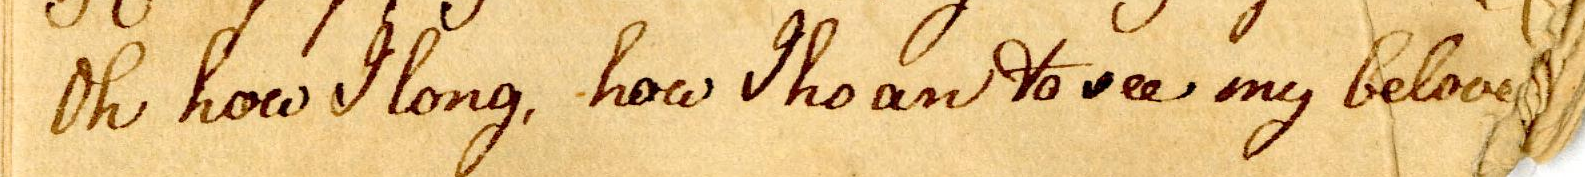Oh how I long, how I ho an to see my belove
